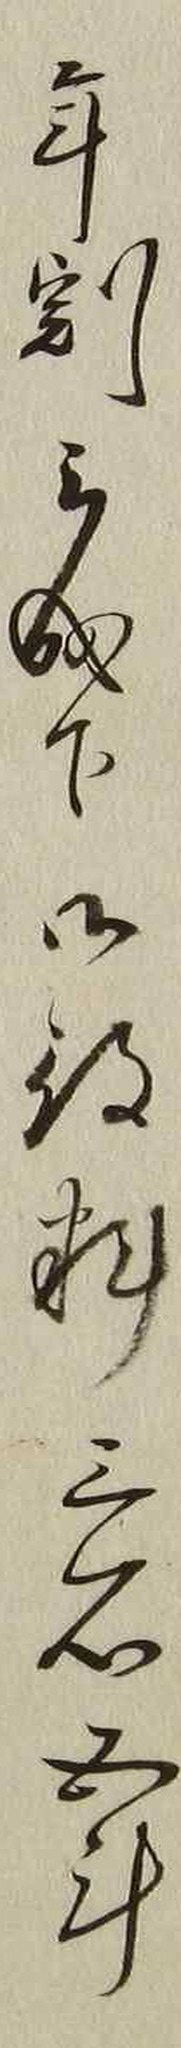年割被成下御役料三石五斗
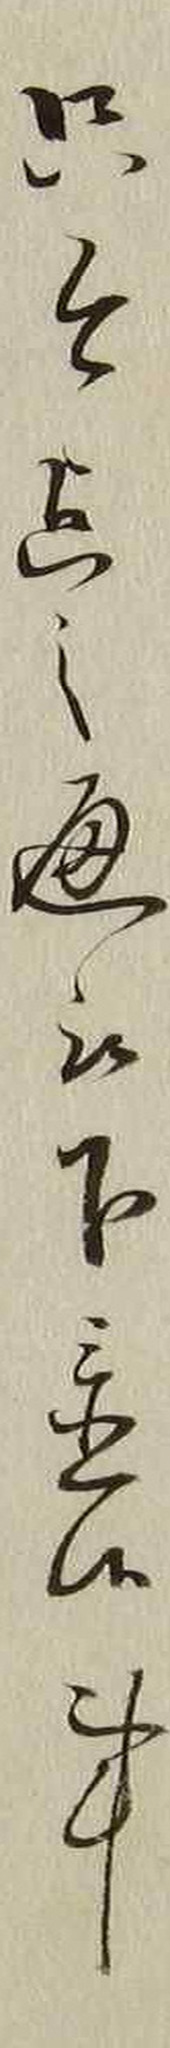只今迄之通被下置候事
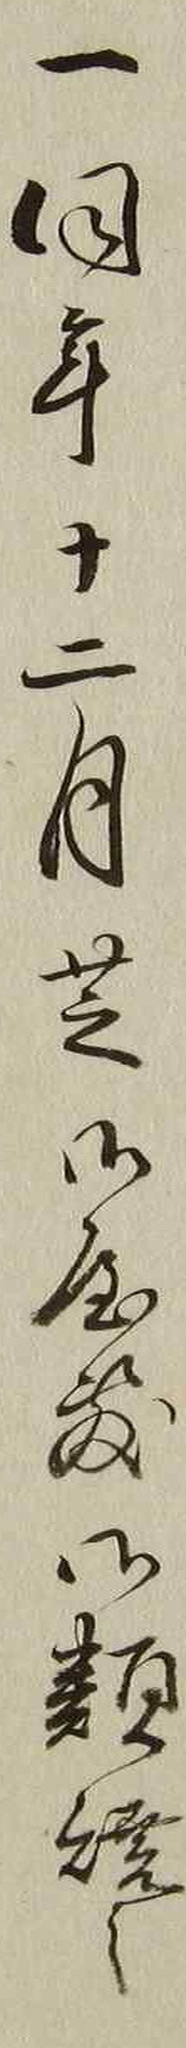一同年十二月芝御屋敷御類焼之
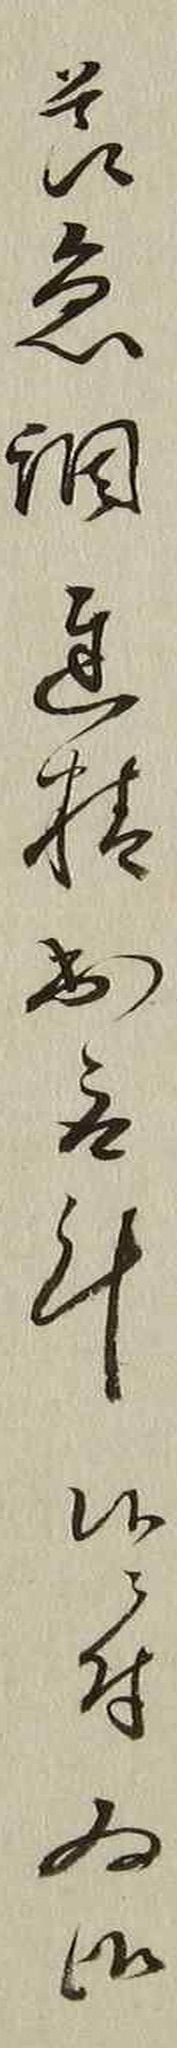節急調達精出取計候ニ付為御
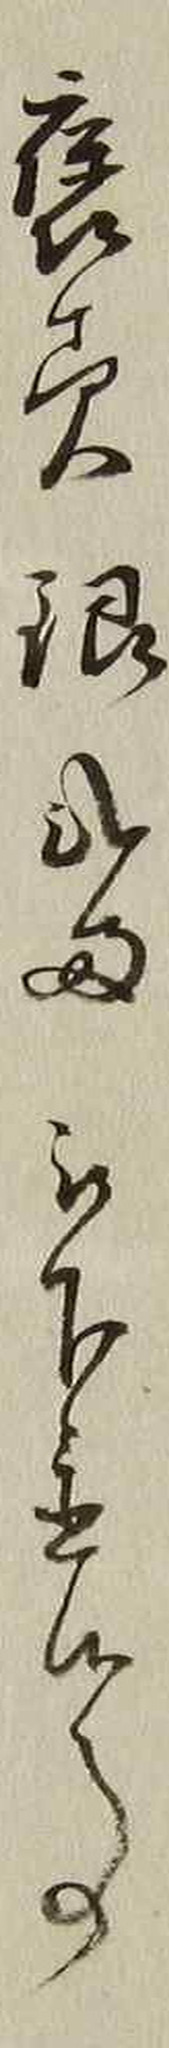褒美銀弐両被下置候事
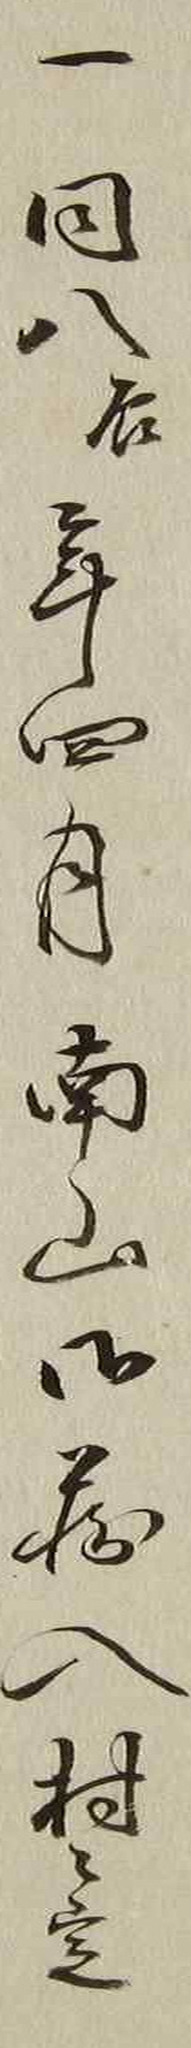一同八辰年四月南山御蔵入村ニ定
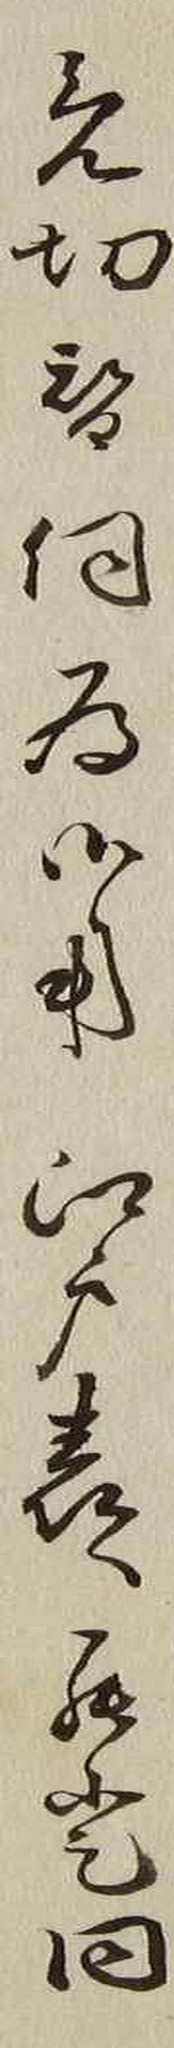免切替伺為御用江戸表へ罷登同
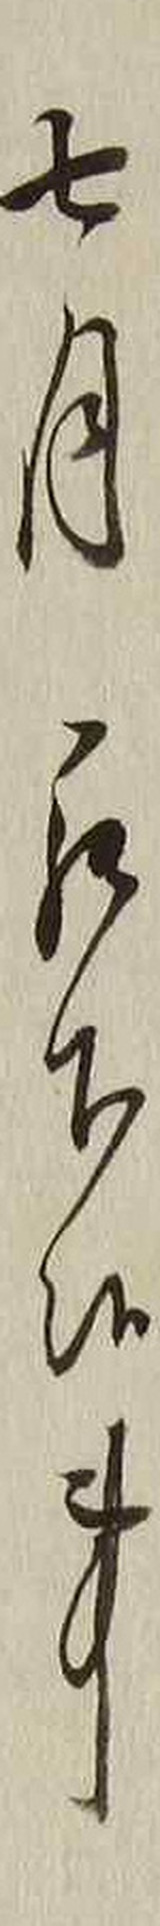七月罷下候事
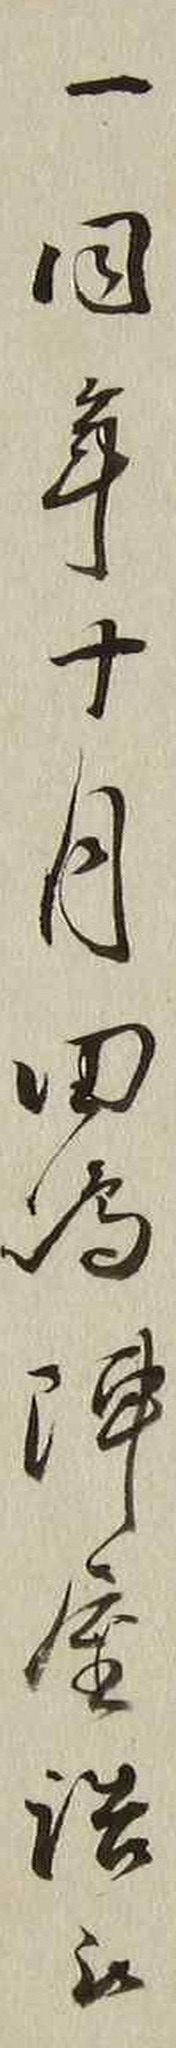一同年十月田嶋陣屋詰被
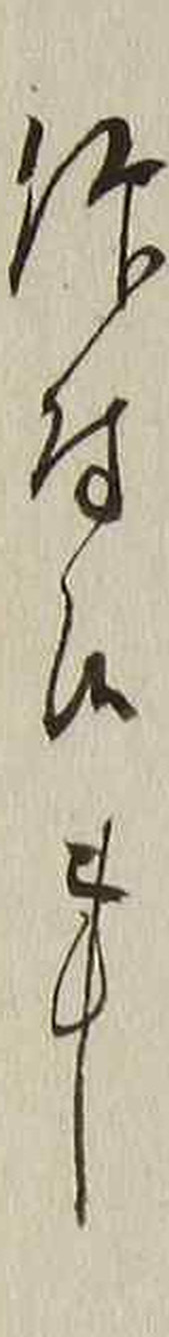仰付候事
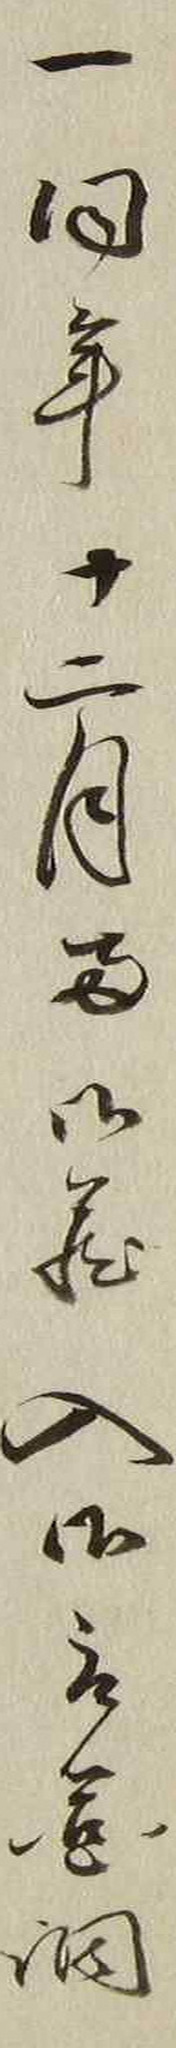一同年十二月当御蔵入御取箇調
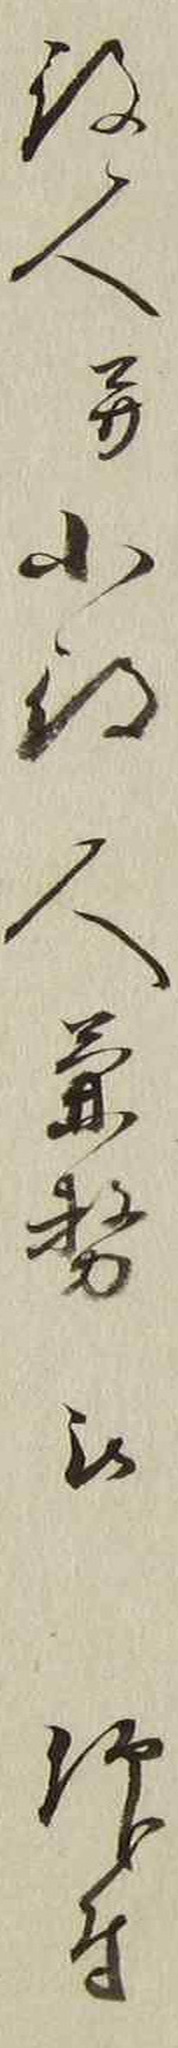役人幷小役人兼務被仰付
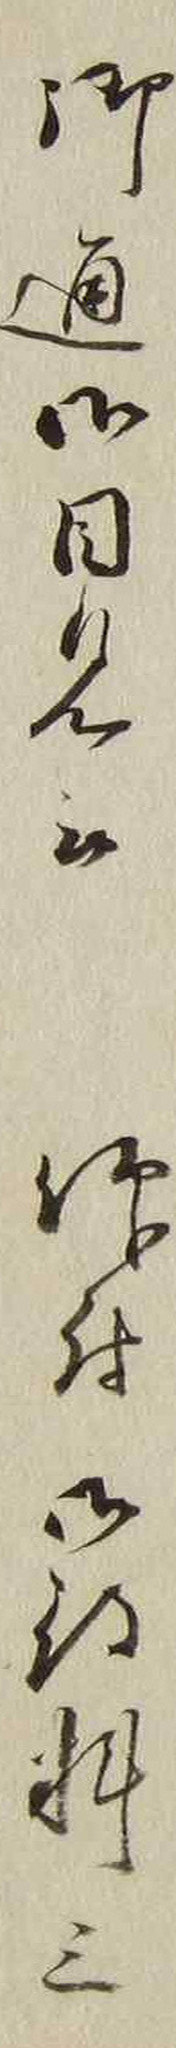御通御目見被仰付御役料三
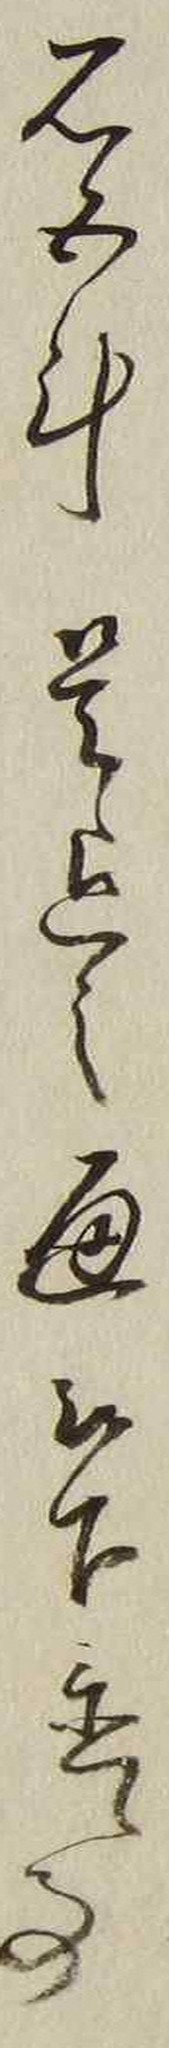石五斗是迄之通被下置候事

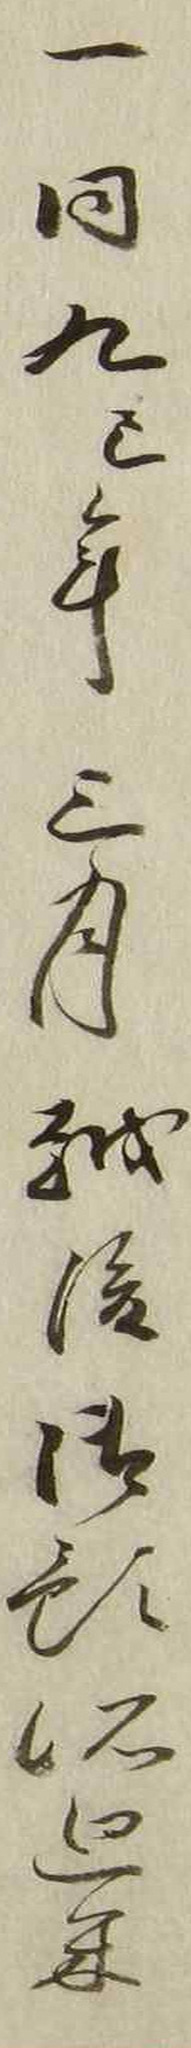一同九巳年三月越後御預所廻米
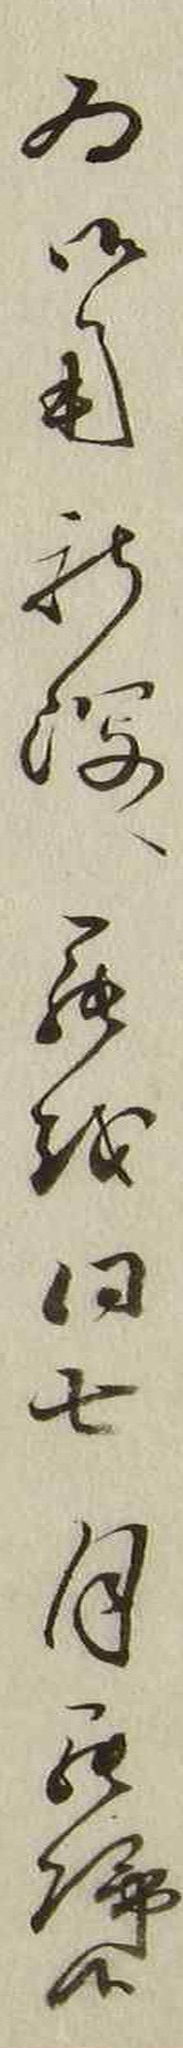為御用新潟へ罷越同七月罷帰候
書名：諸士系譜　巻之52　に之部3
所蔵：会津若松市立会津図書館
